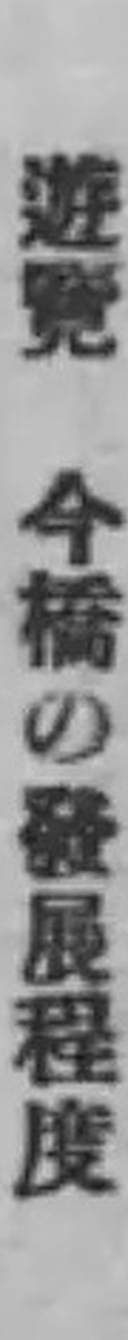遊覧今橋の発展程度
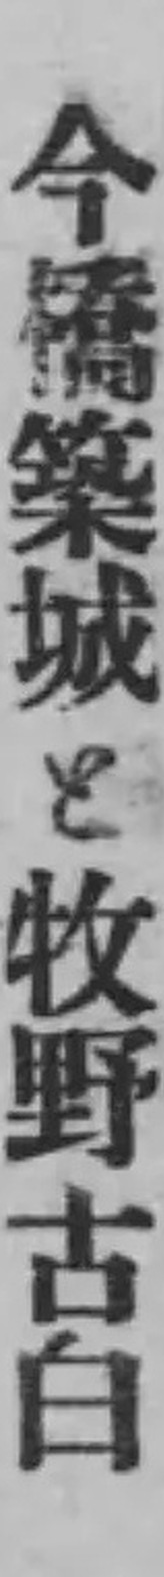今橋築城と牧野古白
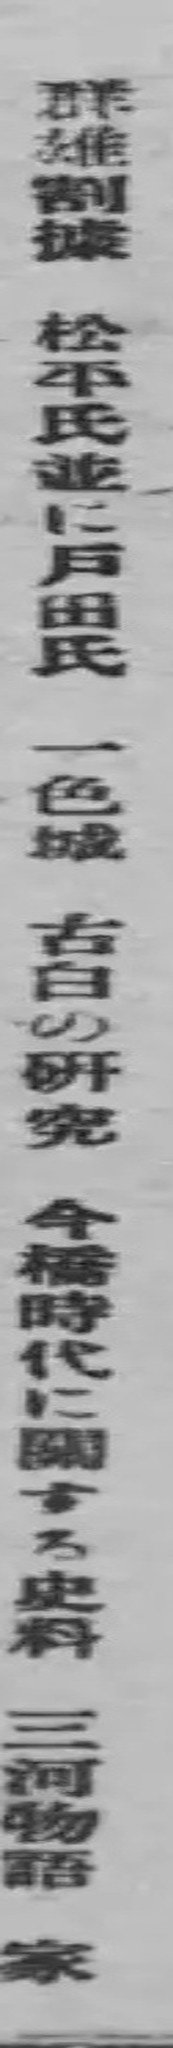群雄割拠松平氏並に戸田氏一色城古白の研究今橋時代に関する史料三河物語家
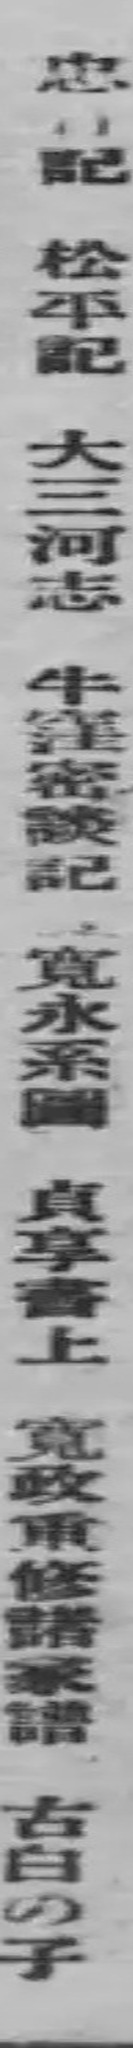忠日記松平記大三河志牛窪密談記寛永系図貞享書上寛政重修諸家譜古白の子
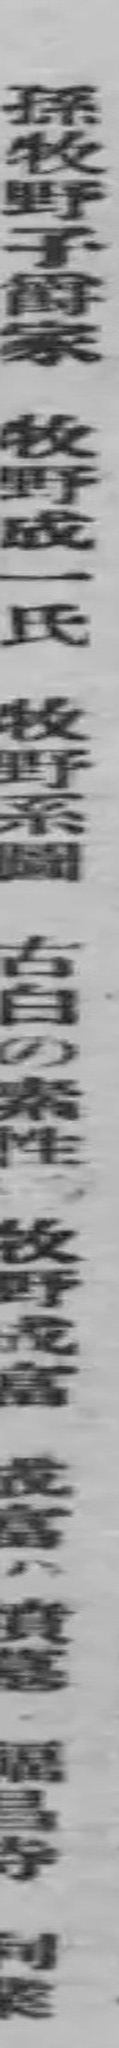孫牧野子爵家牧野成一氏牧野系図古白の素性牧野成富成富の墳墓福昌寺利業
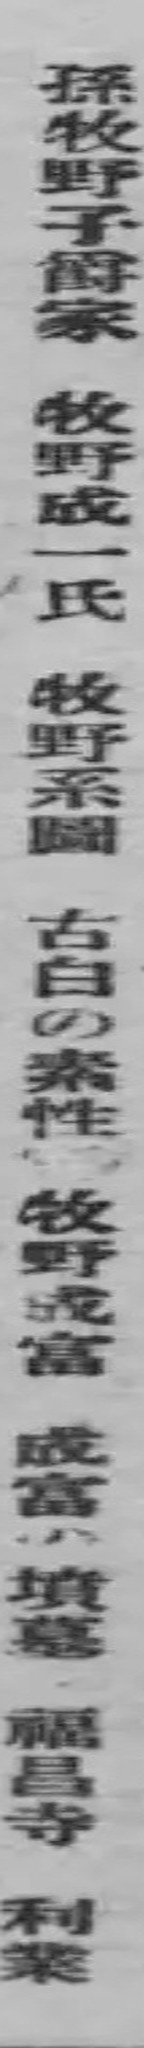孫牧野子爵家牧野成一氏牧野系図古白の素性牧野成富成富の墳墓福昌寺利業
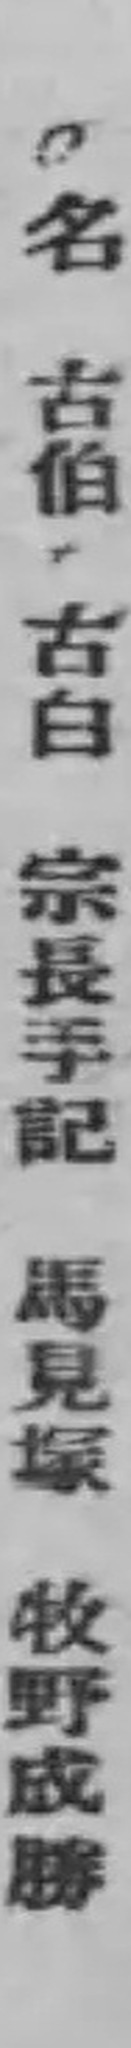の名古伯の古白宗長手記馬見塚牧野成勝
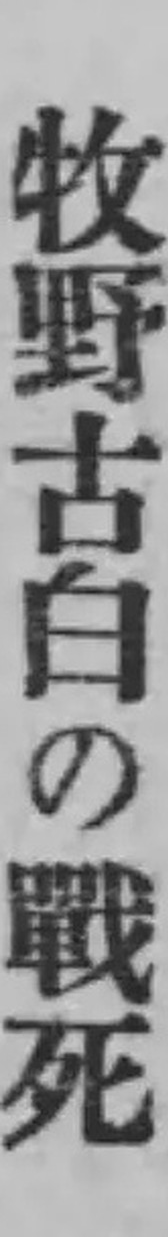牧野古白の戦死
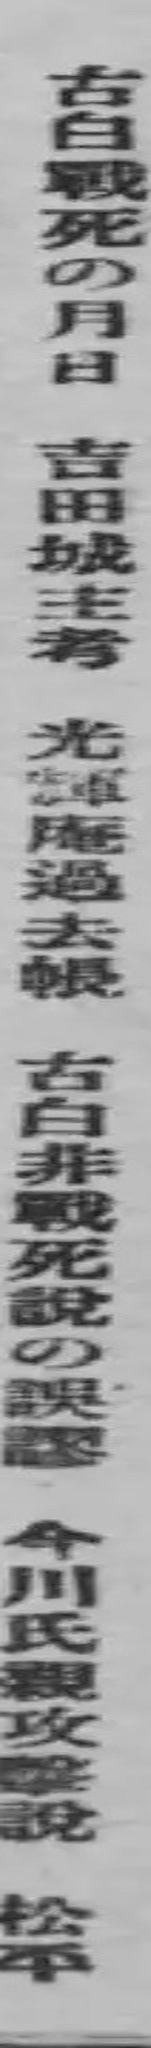古白戦死の月日吉田城主考光輝庵過去帳古白非戦死説の誤謬今川氏親攻撃説松平
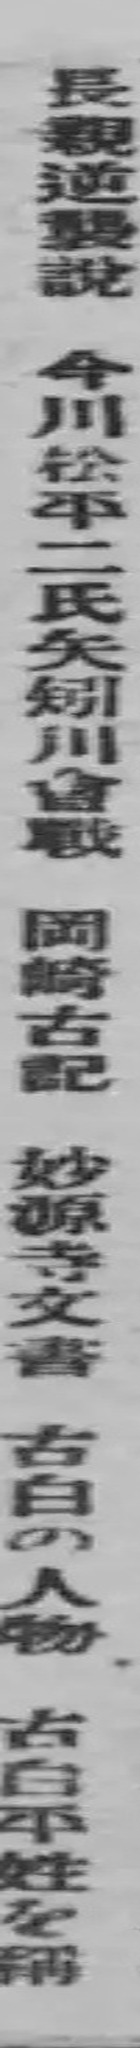長親逆襲説今川松平二氏矢矧川合戦岡崎古記妙源寺文書古白の人物古白平姓を称
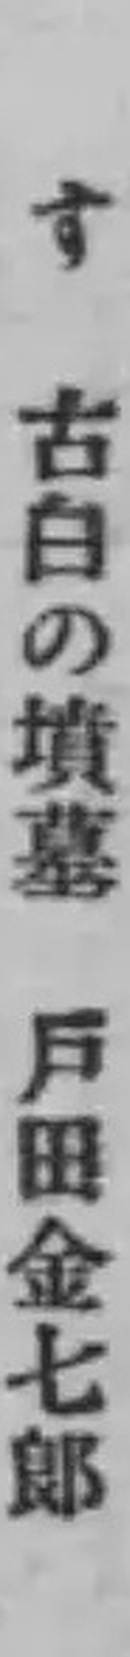す古白の墳墓戸田金七郎
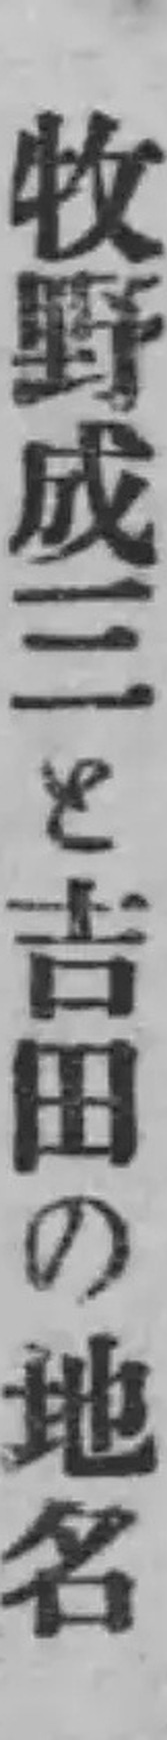牧野成三と吉田の地名
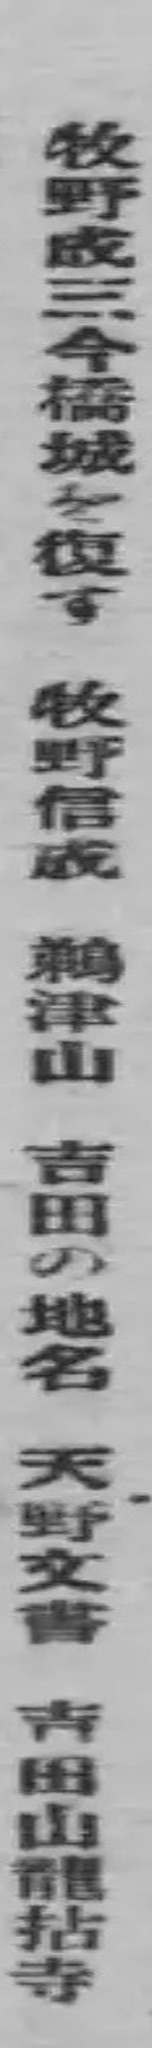牧野成三今橋城を復す牧野信成鵜津山吉田の地名天野文書吉田山龍拈寺
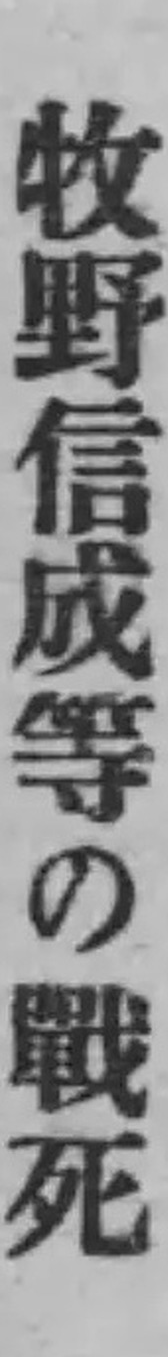牧野信成等の戦死
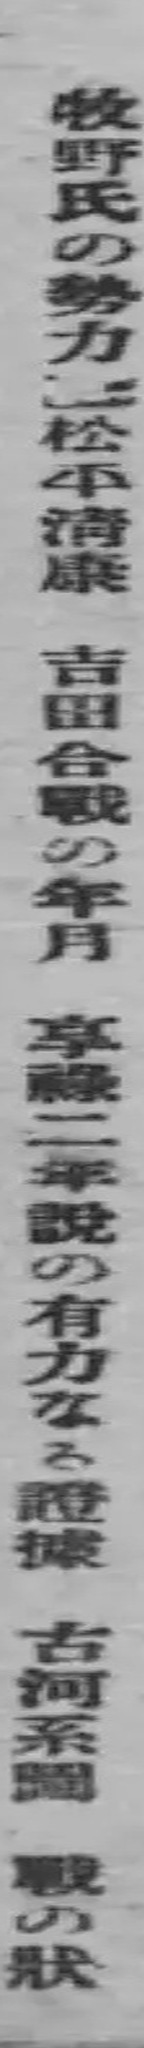牧野氏の勢力松平清康吉田合戦の月日享禄二年説の有力なる証拠古河系図戦の状

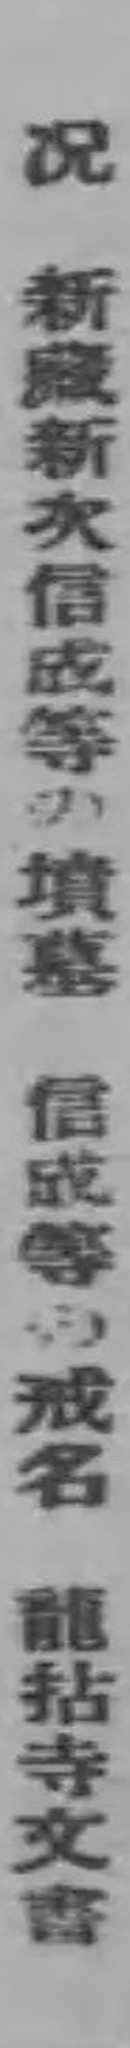祝新蔵新次信成等の墳墓信成等の戒名龍拈寺文書
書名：豊橋市史談
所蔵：国立国会図書館 National Diet Library, JAPAN
